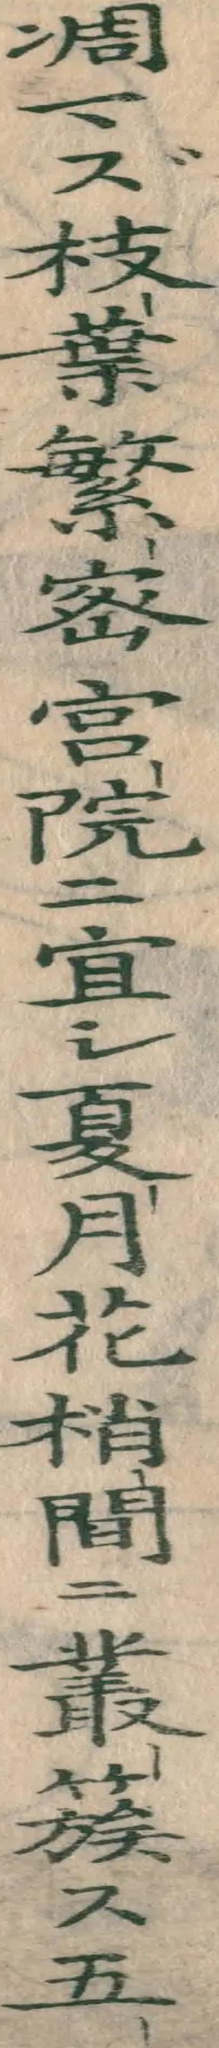凋マズ枝-葉繁-密宮-院ニ宜シ夏-月花梢-間ニ叢-簇ス五-
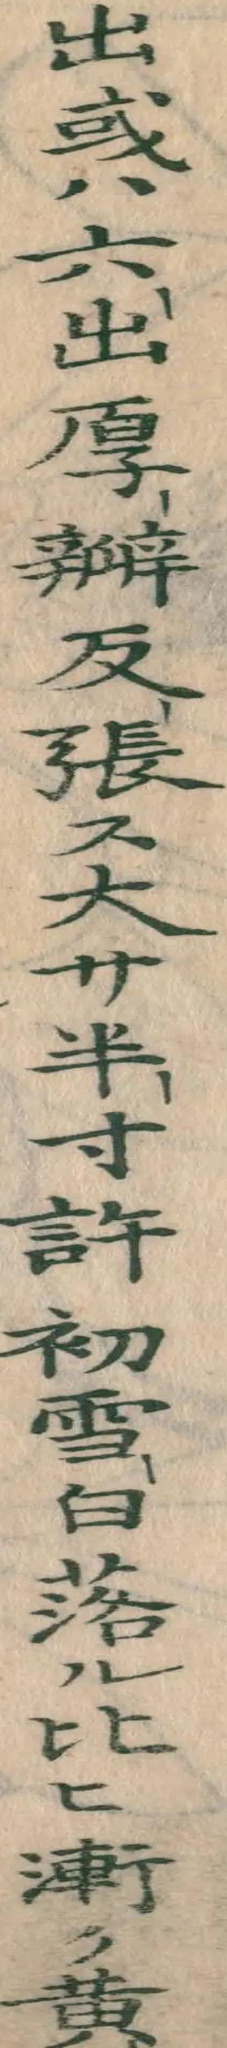出或ハ六-出厚-弁反-張ス大サ半-寸許初雪-白落ル比ヒ漸ク黄-

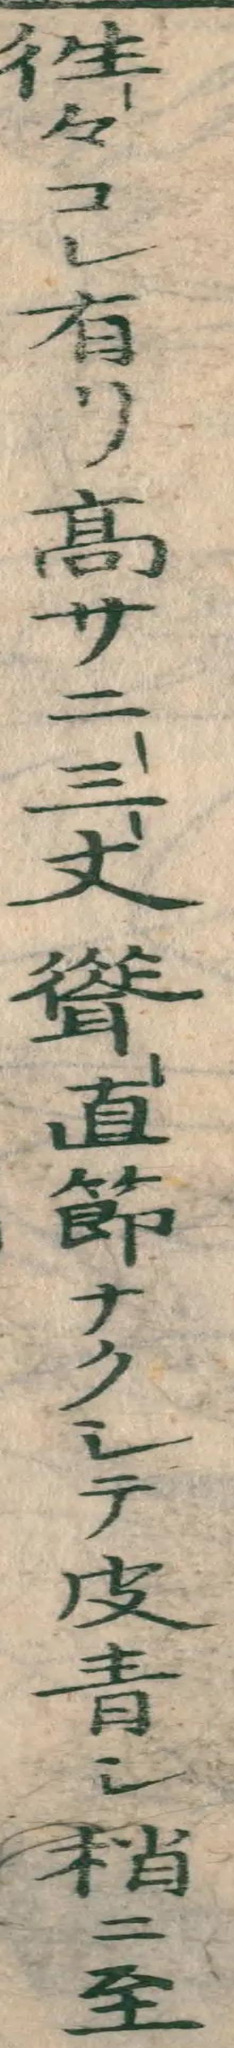往-々コレ有リ高サ二-三-丈聳-直節ナクシテ皮青シ梢ニ至
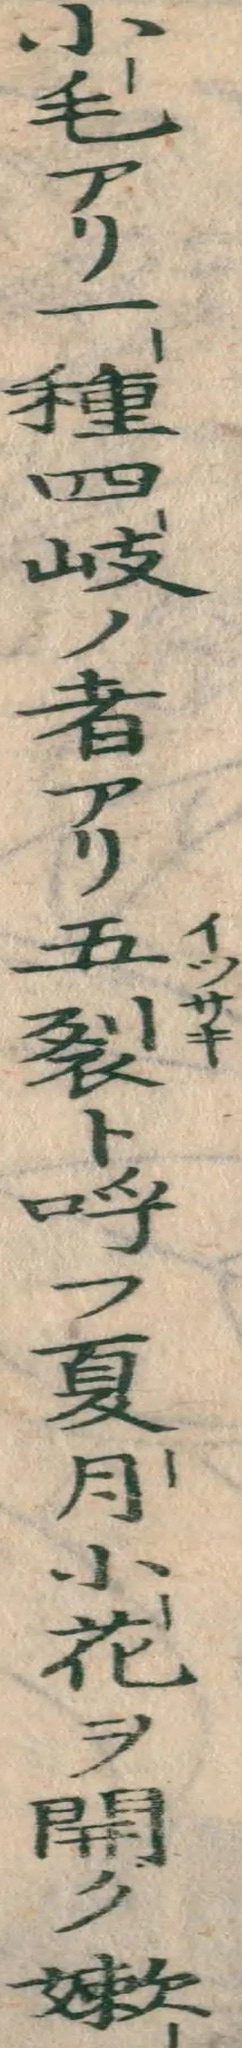小-毛アリ一-種四-岐ノ者アリ五裂ト呼フ夏-月小-花ヲ開ク嫩-
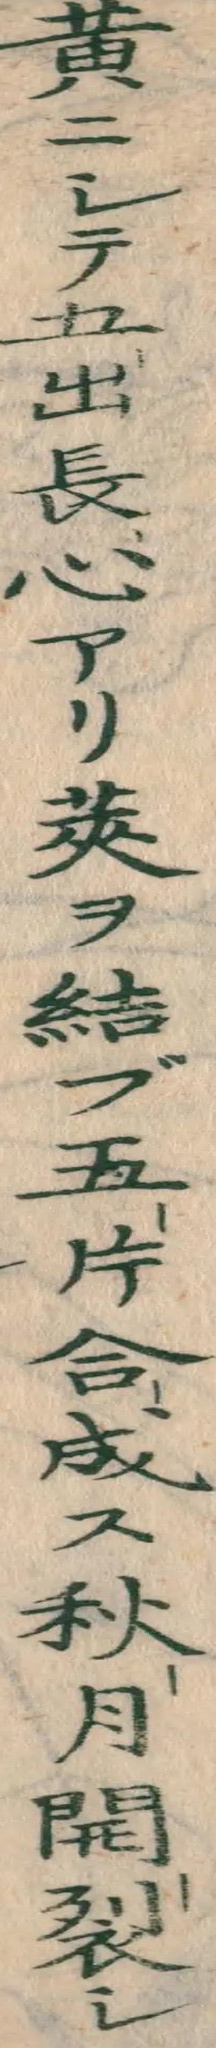黄ニシテ五-出長-心アリ莢ヲ結ブ五-片合-成ス秋-月開-裂シ
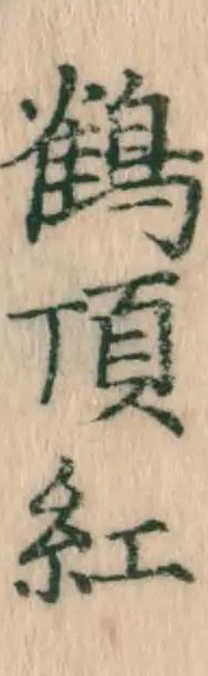鶴頂紅

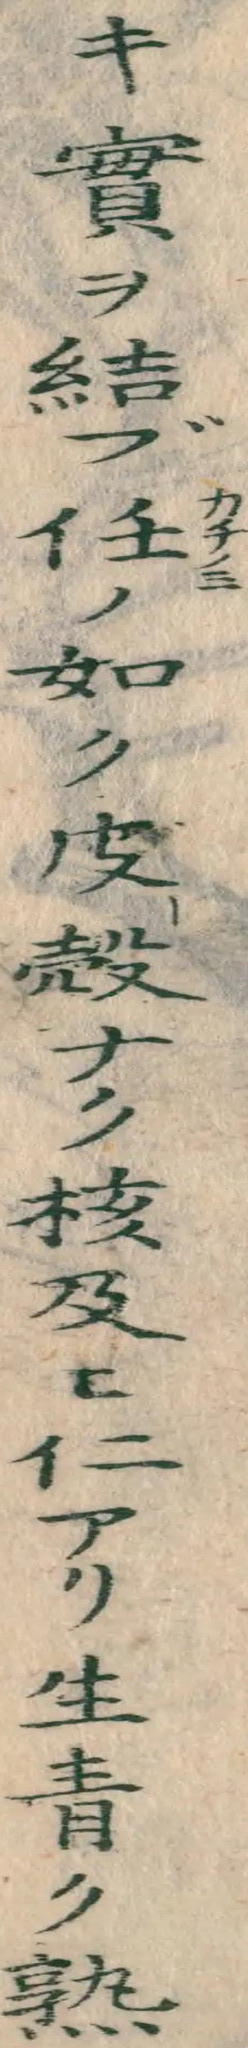キ実ヲ結ブ任ノ如ク皮-殻ナク核及ヒ仁アリ生青ク熟
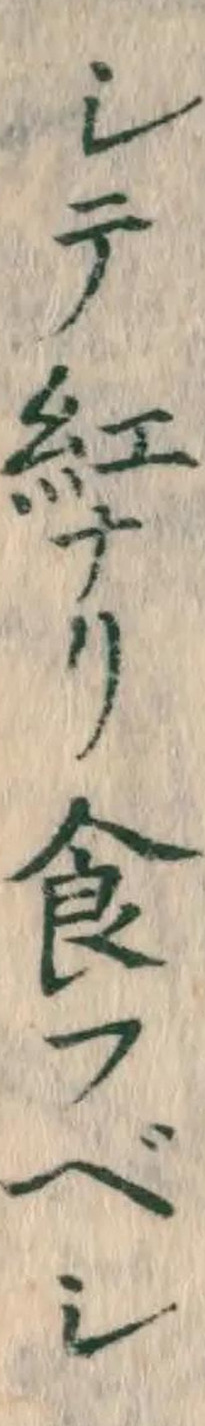シテ紅ナリ食フベシ
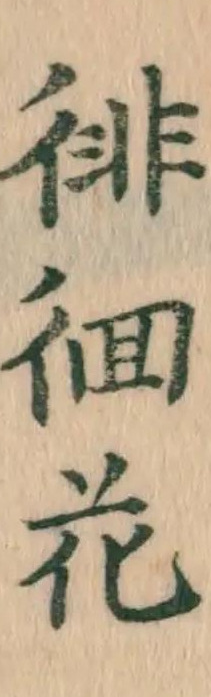徘徊花

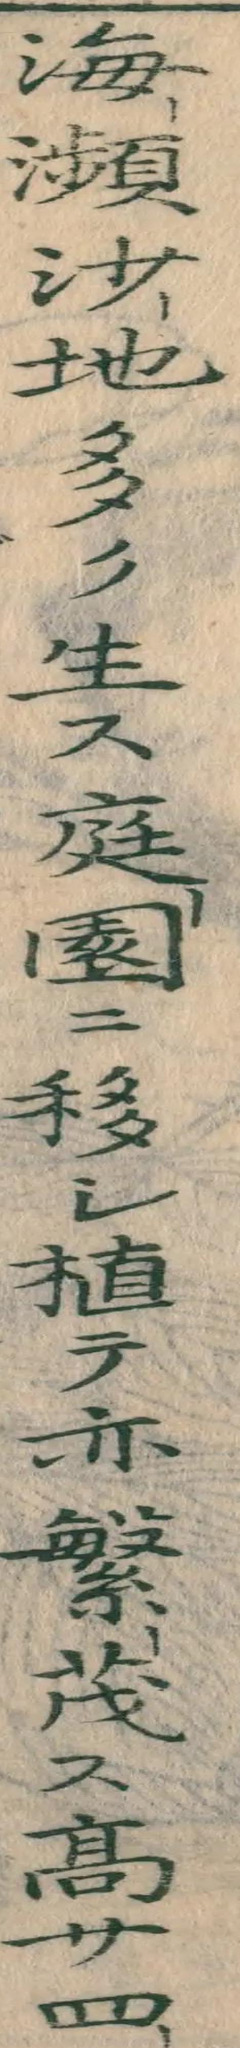海-瀕沙-地多ク生ス庭-園ニ移シ植テ亦繁-茂ス高サ四-
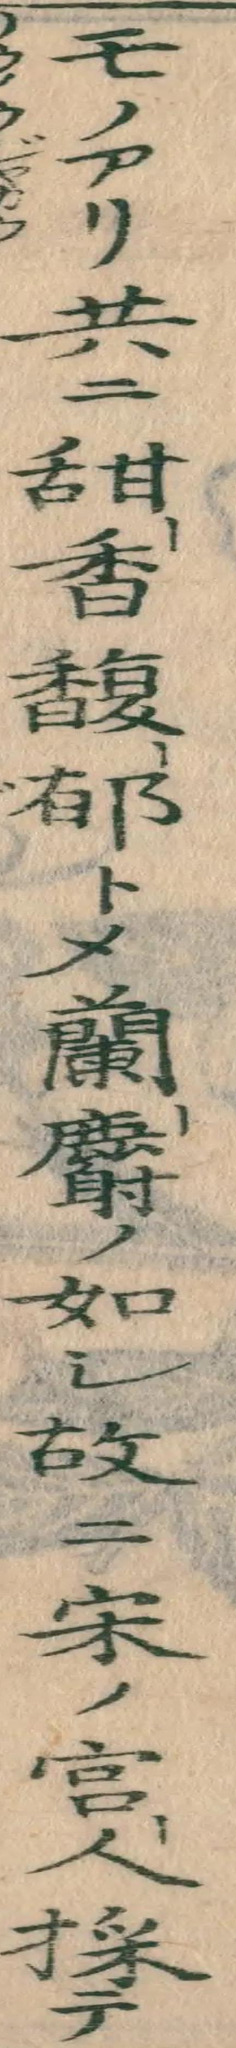モノアリ共ニ甜-香馥-郁トシテ蘭-麝ノ如シ故ニ宋ノ宮-人採テ
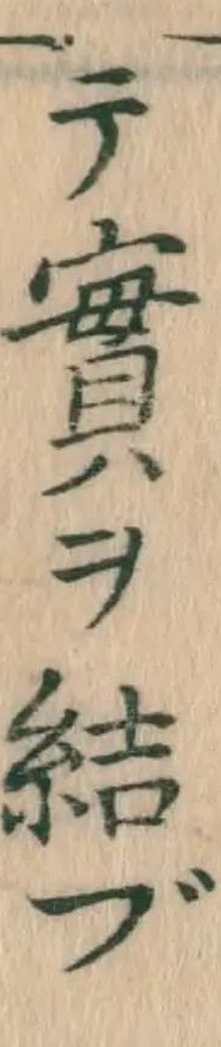テ実ヲ結ブ
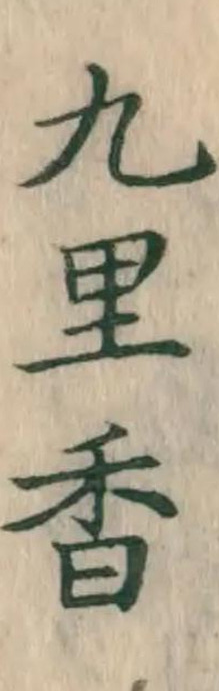九里香

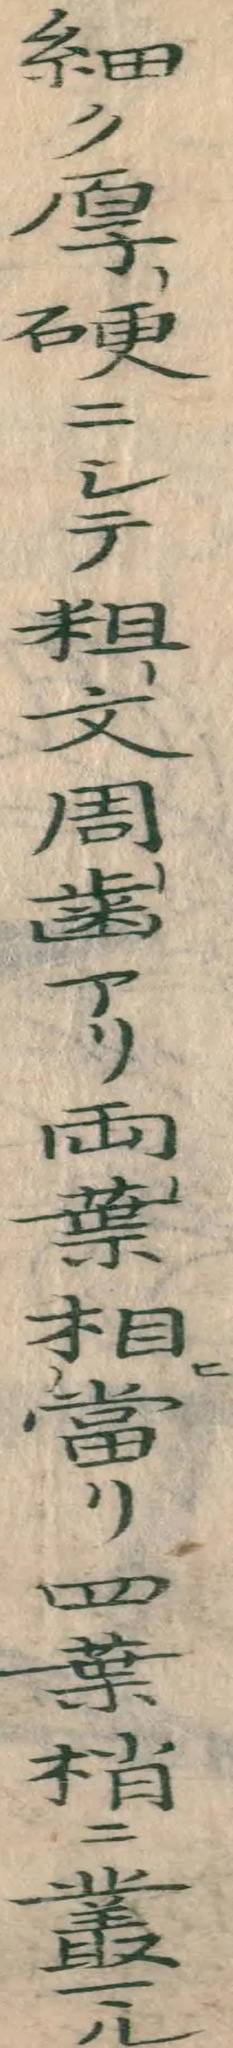細ク厚-硬ニシテ粗-文周-歯アリ両-葉相-当リ四葉梢ニ叢マル
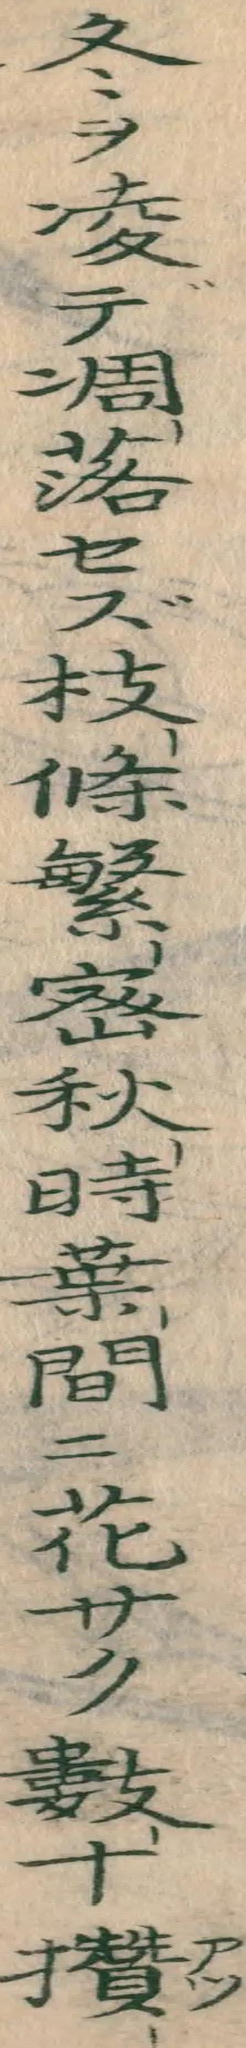冬ヲ凌デ凋-落セズ枝-条繁-密秋-時葉-間ニ花サク数-十攢-
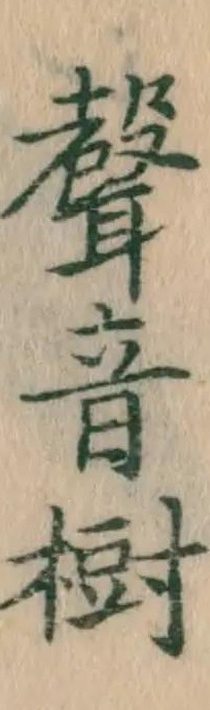声音樹
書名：花彙 草部4巻木部4巻. [2]
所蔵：国立国会図書館 National Diet Library, JAPAN
